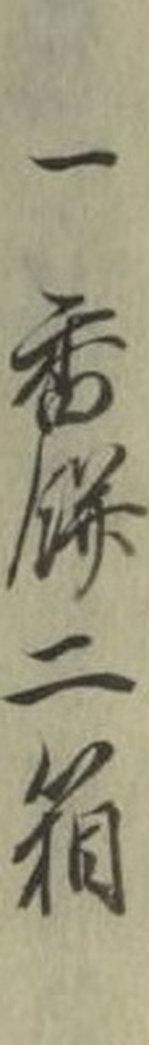一香餅二箱
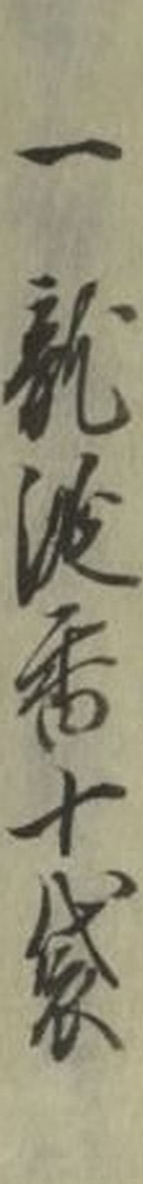一龍涎香十袋
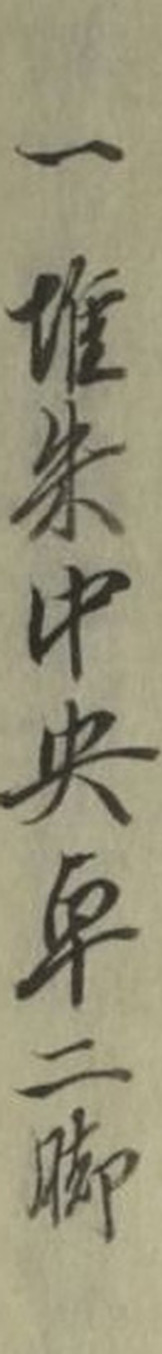一堆朱中央卓二脚
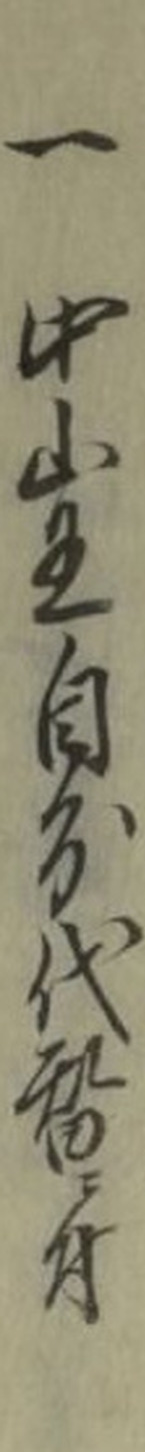一中山王自分代替に付
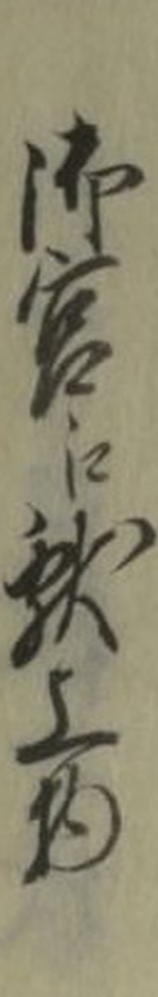御宮え献上物

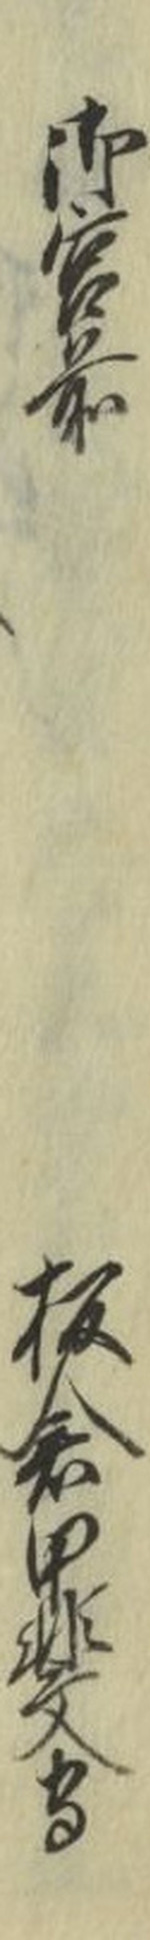御宮前板倉甲斐守
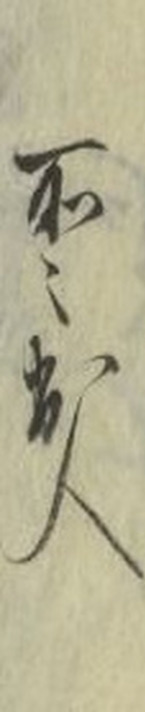所々出人
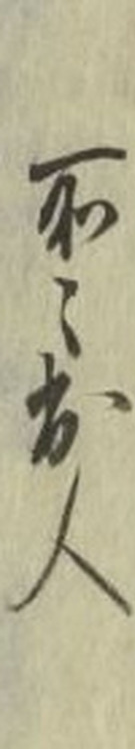所々出人
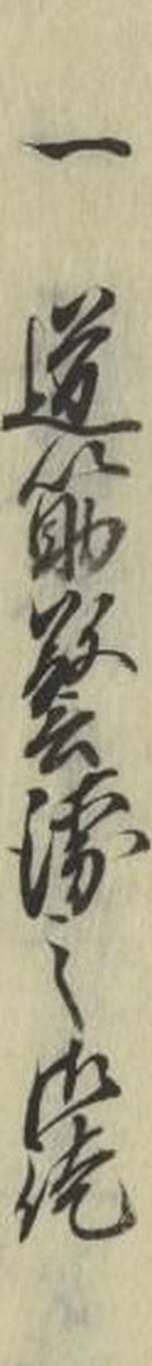一道筋警衛之御徒
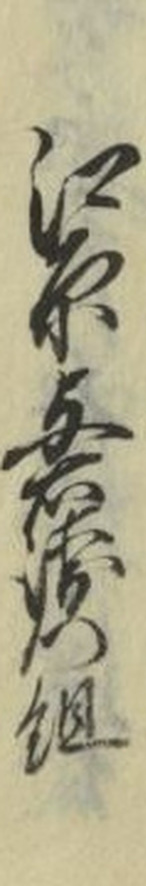江原与右衛門組
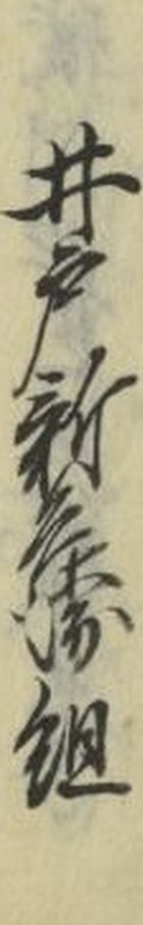井戸新兵衛組
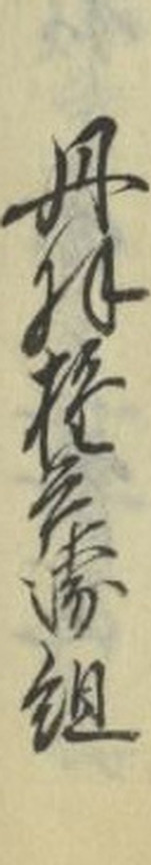丹羽権兵衛組
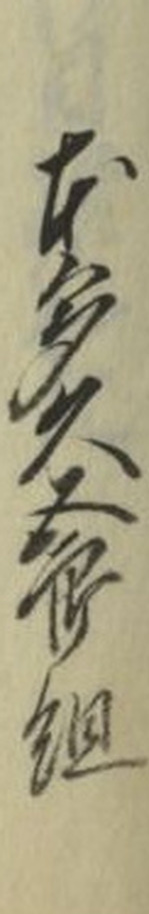本多久五郎組
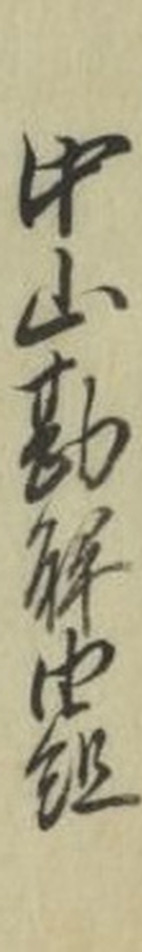中山勘解由組
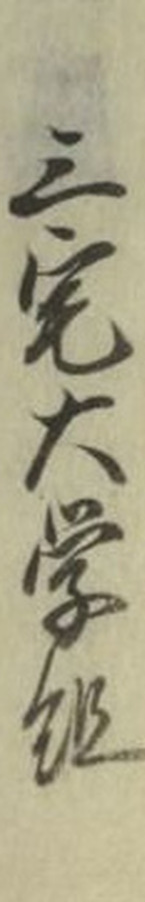三宅大学組
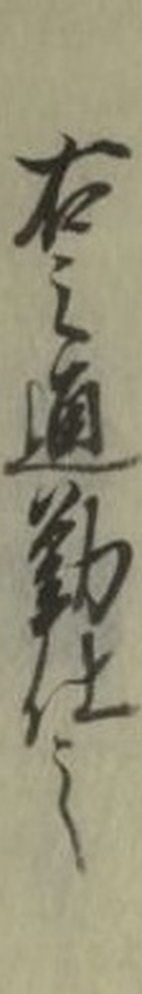右之通仕之
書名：琉球人参府記
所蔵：University of the Ryukyus Library
